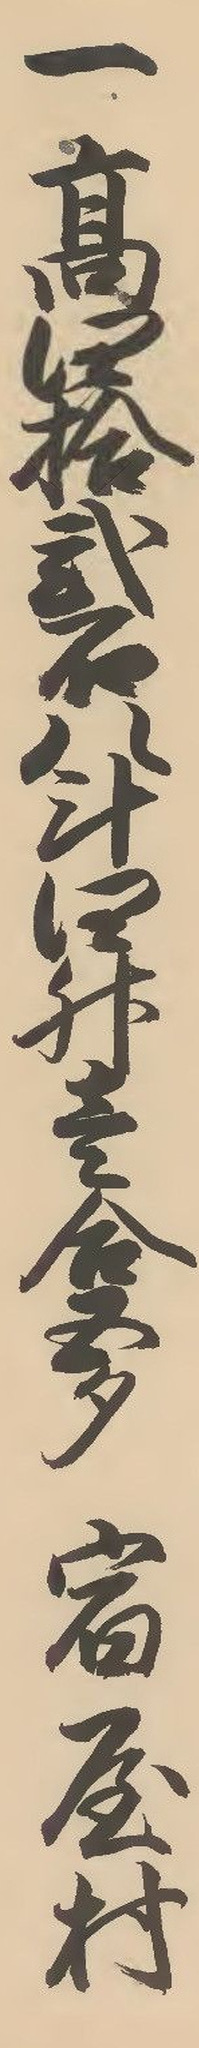一高四拾弐石八斗四升壱合五勺宿屋村

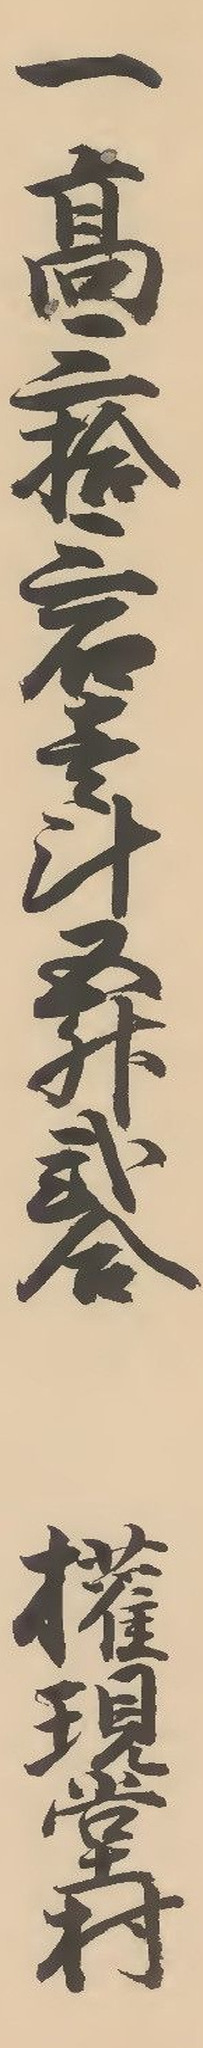一高三拾三石壱斗五升弐合権現堂村
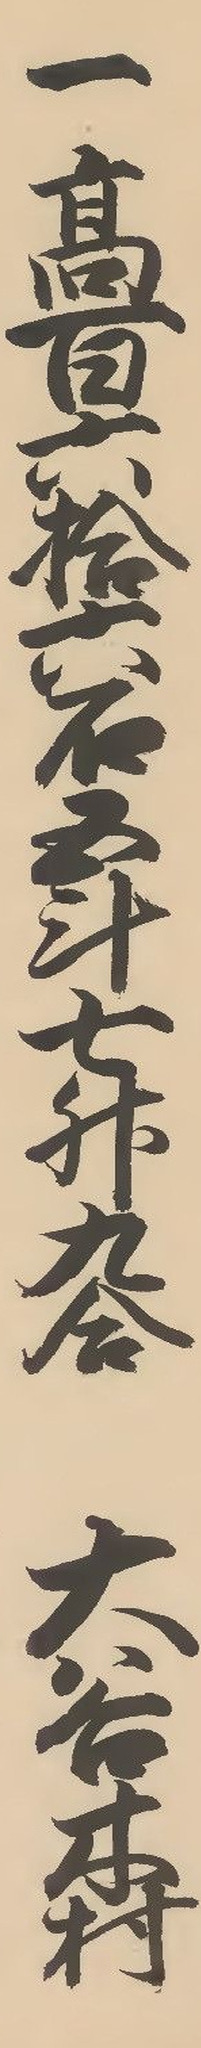一高百六拾六石五斗七升九合大谷木村
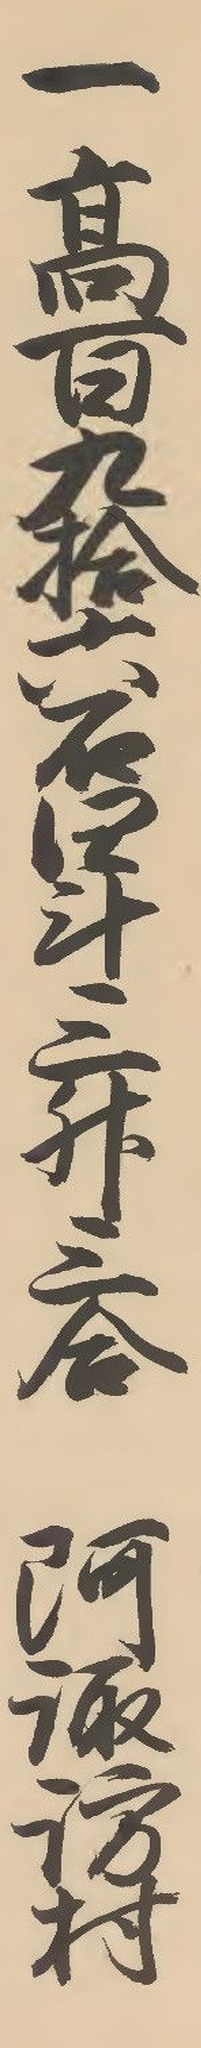一高百九拾六石四斗三升三合阿諏訪村
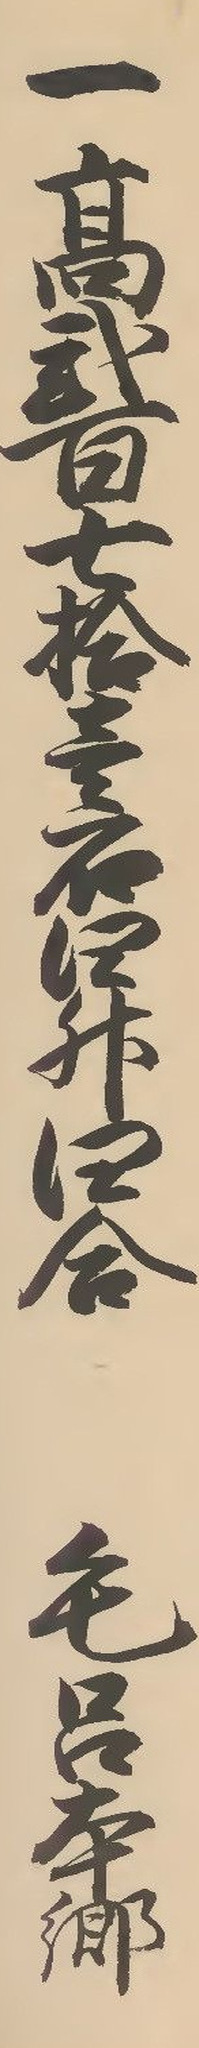一高弐百七拾壱石四升四合毛呂本郷
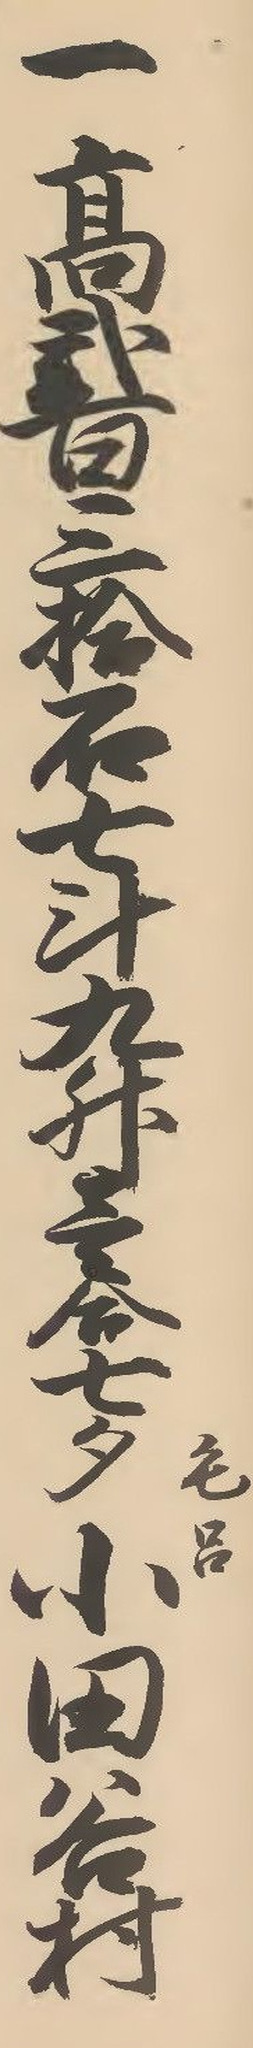一高弐百三拾石七斗九升壱合七勺小田谷村
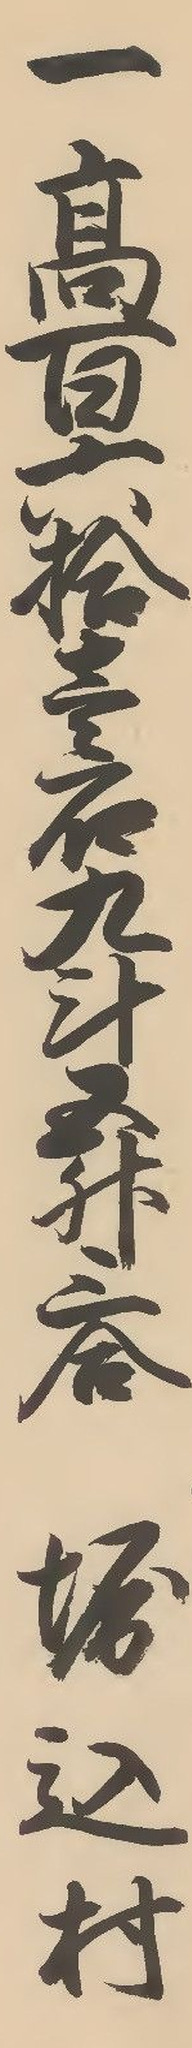一高百六拾壱石九斗五升三合堀込村
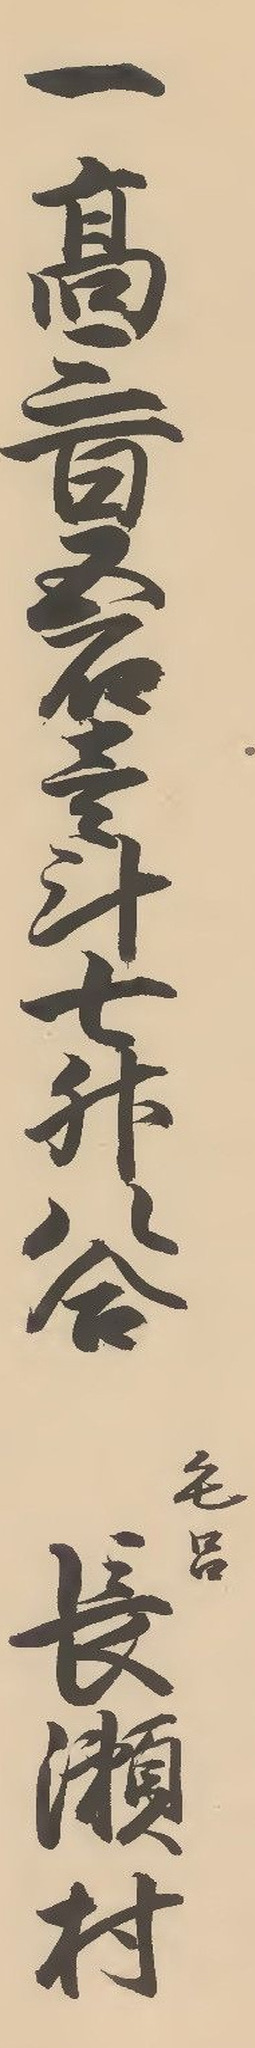一高三百五石壱斗七升八合長瀬村
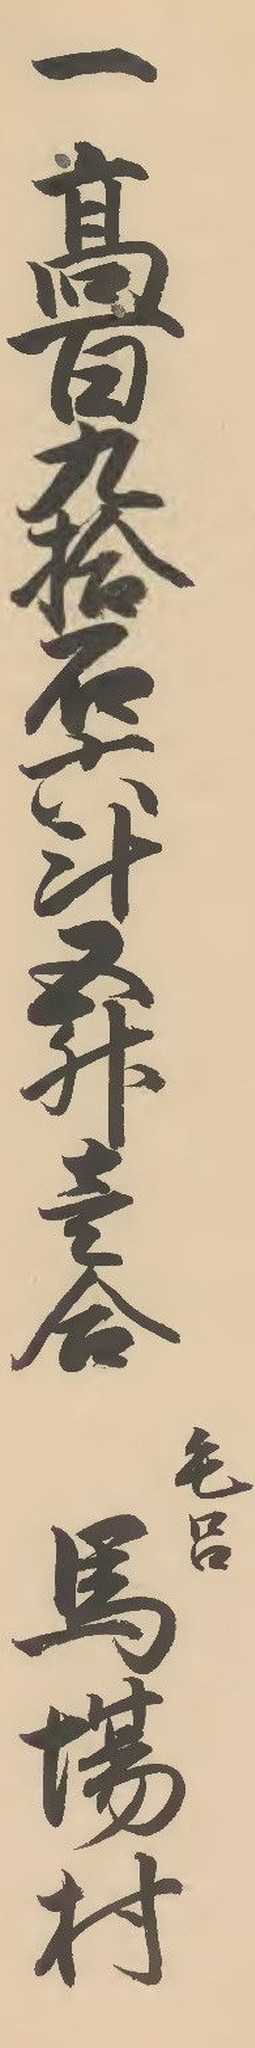一高百九拾石六斗五升壱合馬場村

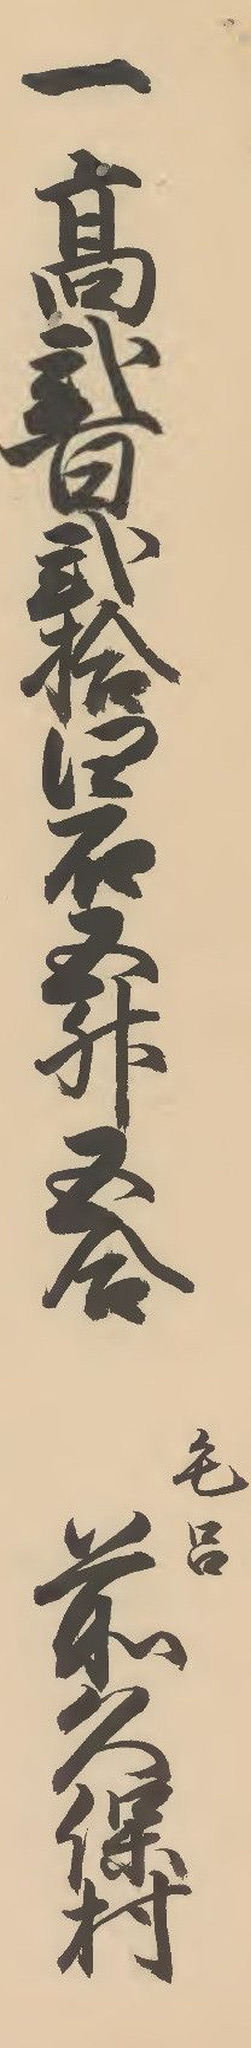一高弐百弐拾四石五升五合前久保村
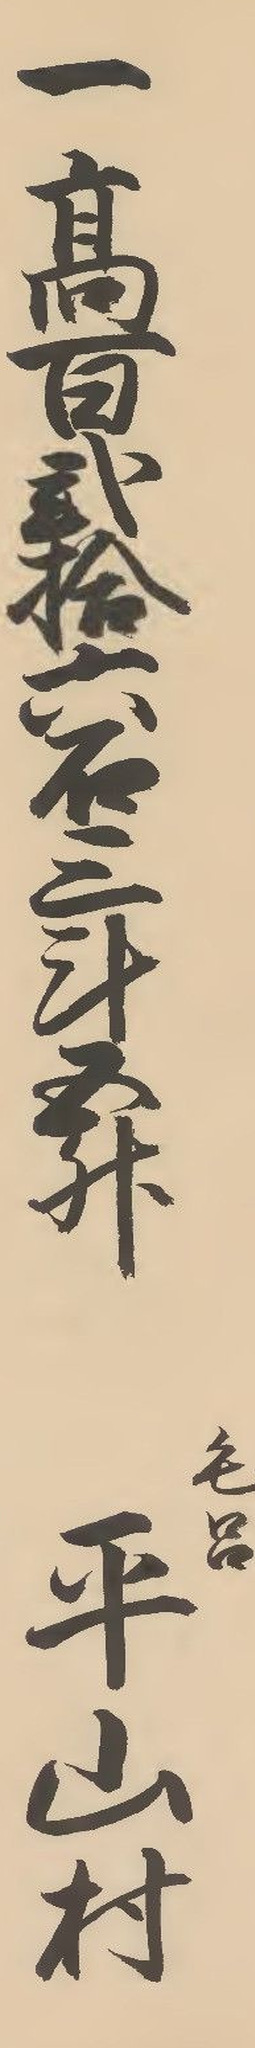一高百弐拾六石三斗五升平山村
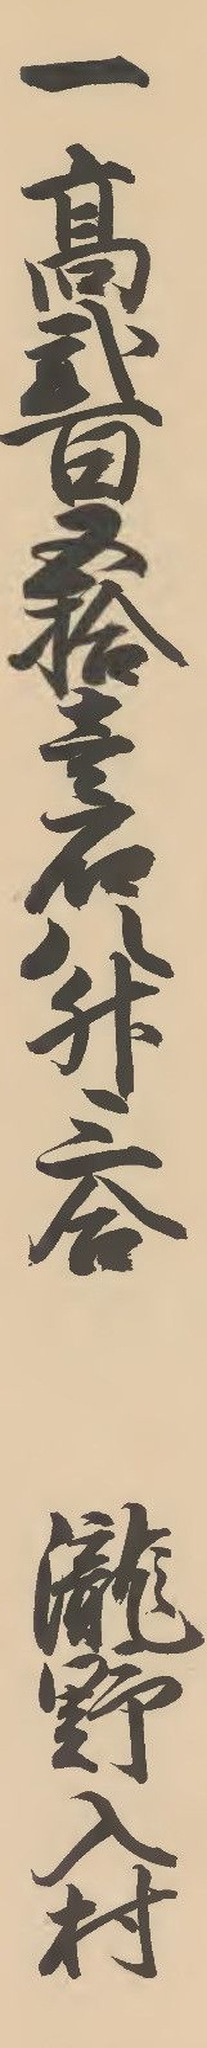一高弐百五拾壱石八升三合瀧野入村
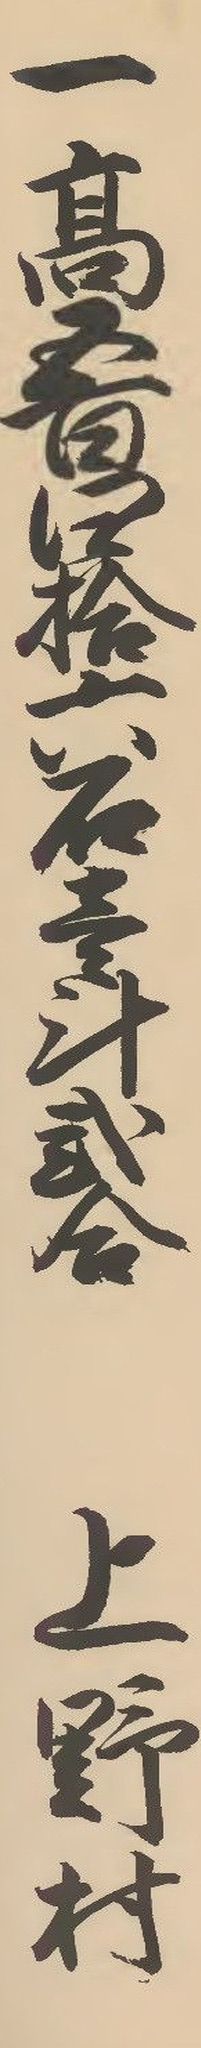一高五百四拾六石壱斗弐合上野村
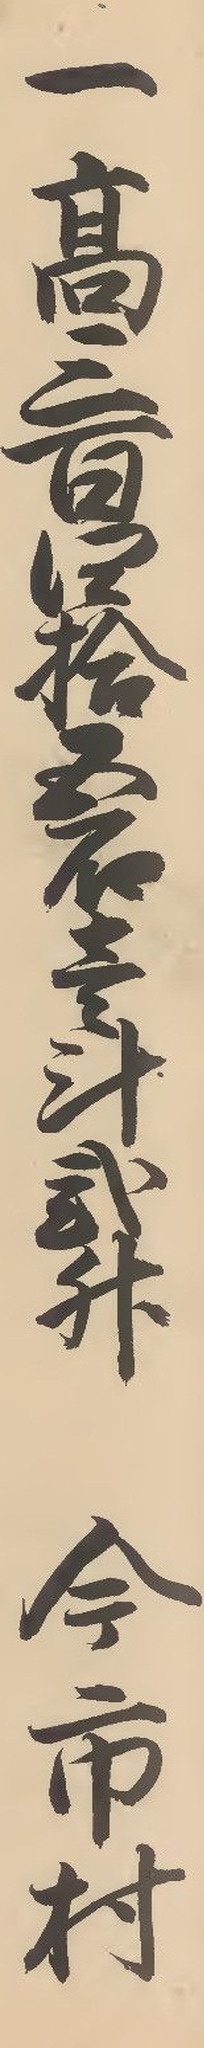一高三百四拾五石壱斗弐升今市村
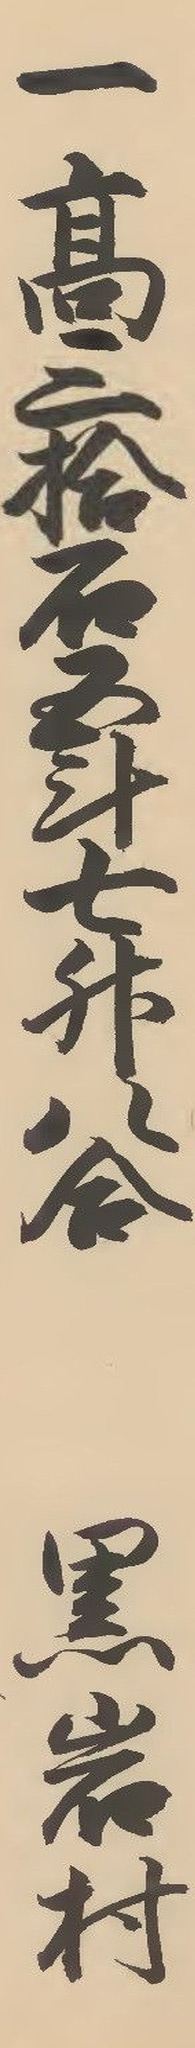一高三拾石五斗七升八合黒岩村
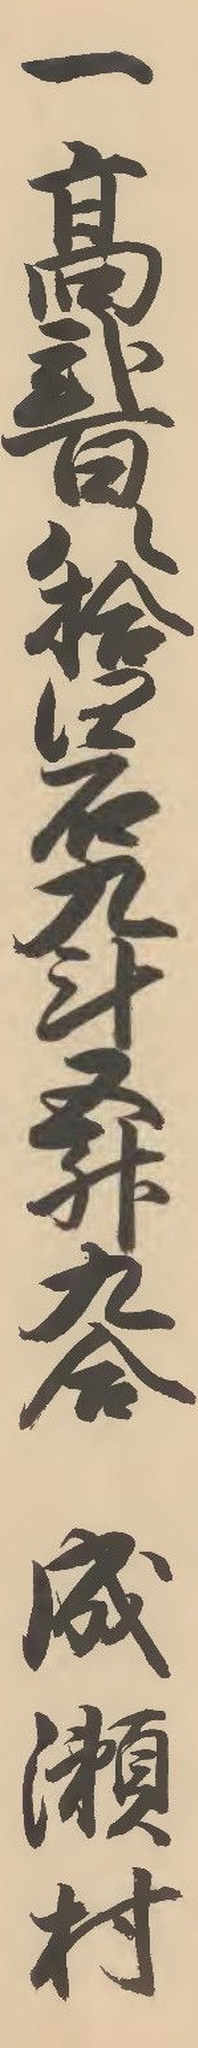一高弐百八拾四石九斗五升九合成瀬村
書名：武蔵国郷帳　上
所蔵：国立公文書館 National Archives of Japan
